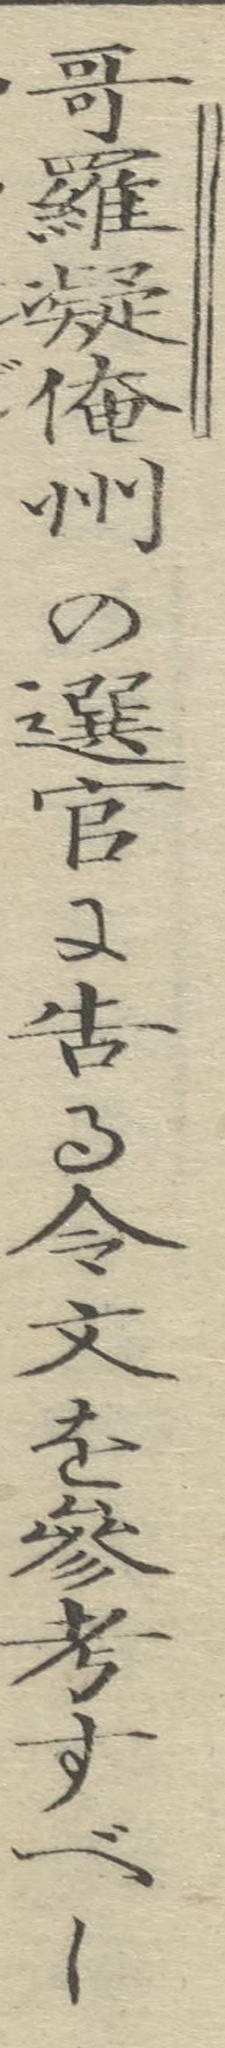哥羅生凝俺州の選官に告る令文を参考すべし
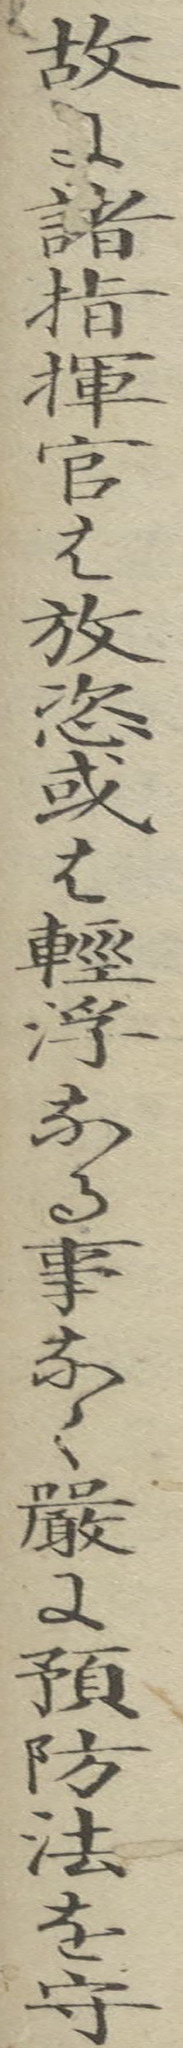故に諸指揮官は放恣或は輕浮なる事なく厳に預防法を守
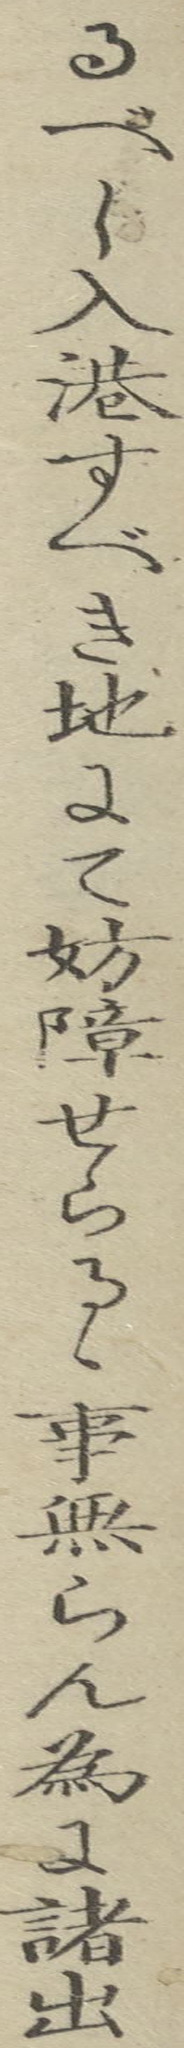るべし入港すべき地にて妨障せらるゝ事無らん為に諸出
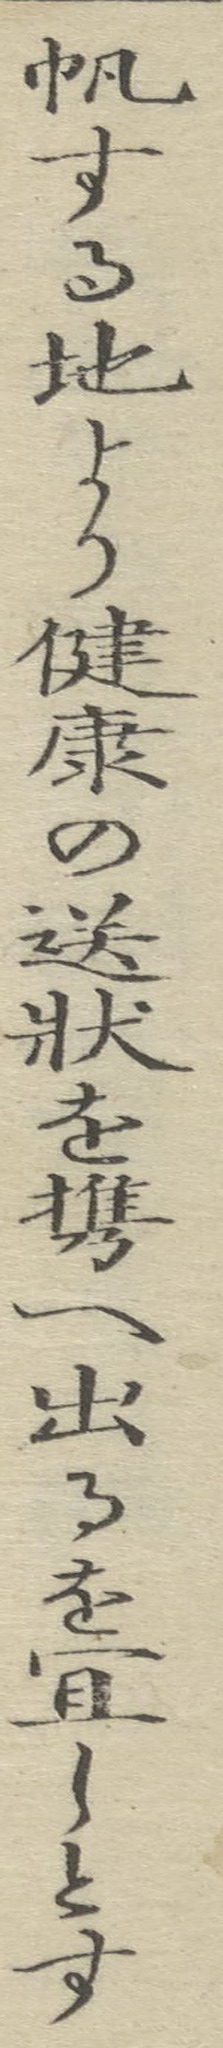帆する地より健康の送状を携へ出るを宜しとす
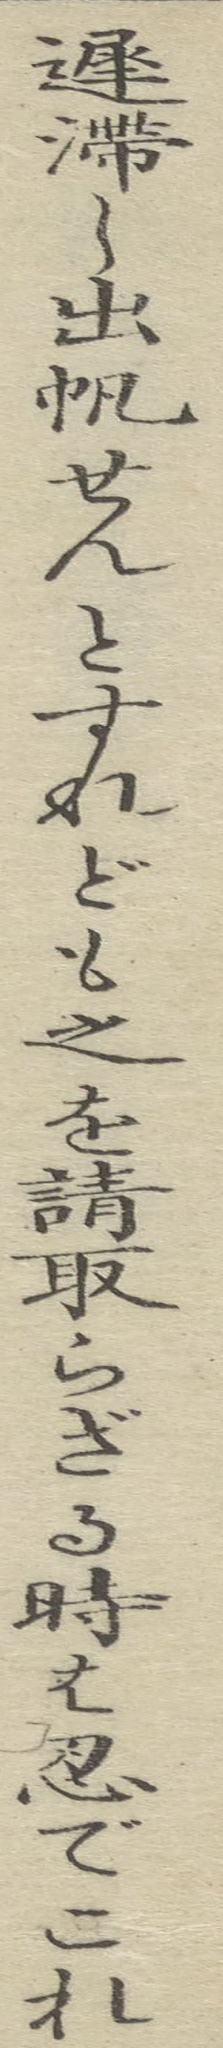遅滞し出帆せんとすれども之を請取らざる時は忍でこれ
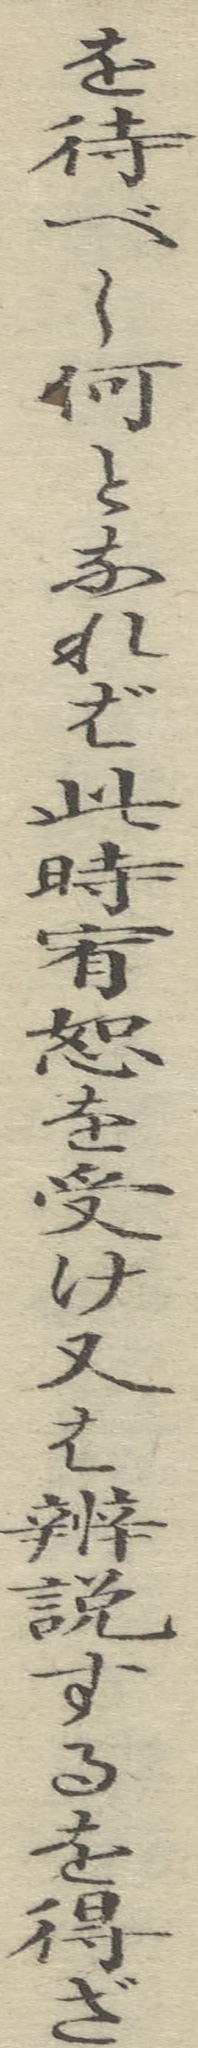を待べし何となれば此時宥恕を受け又は辨説するを得ざ
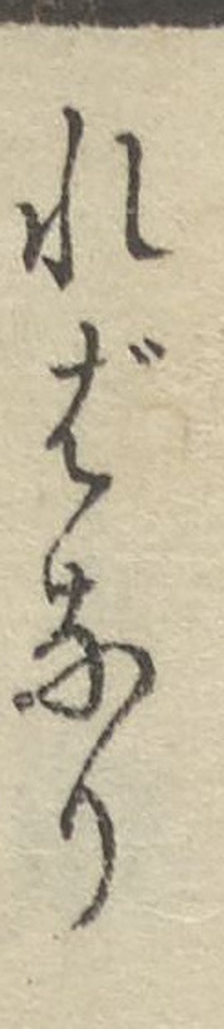ればなり
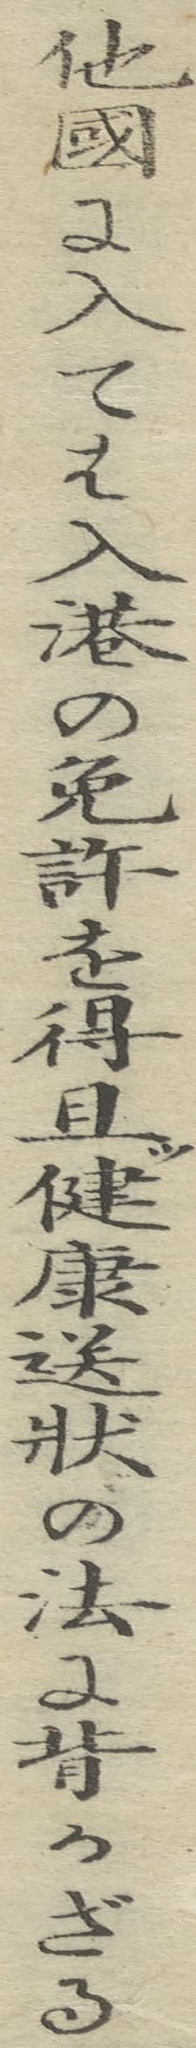他國に入ては入港の免許を得且建康送状の法に背かざる
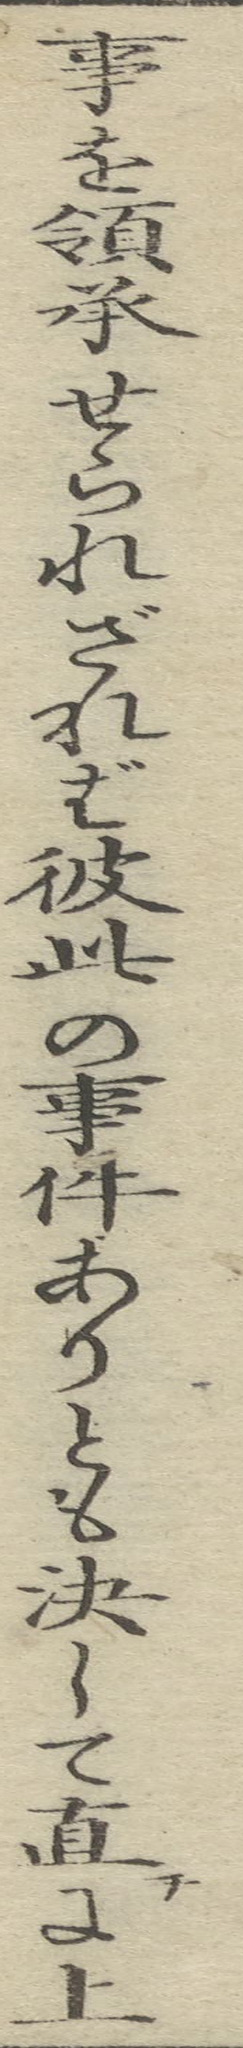事を領承せられざれば彼此の事件ありとも決して直上
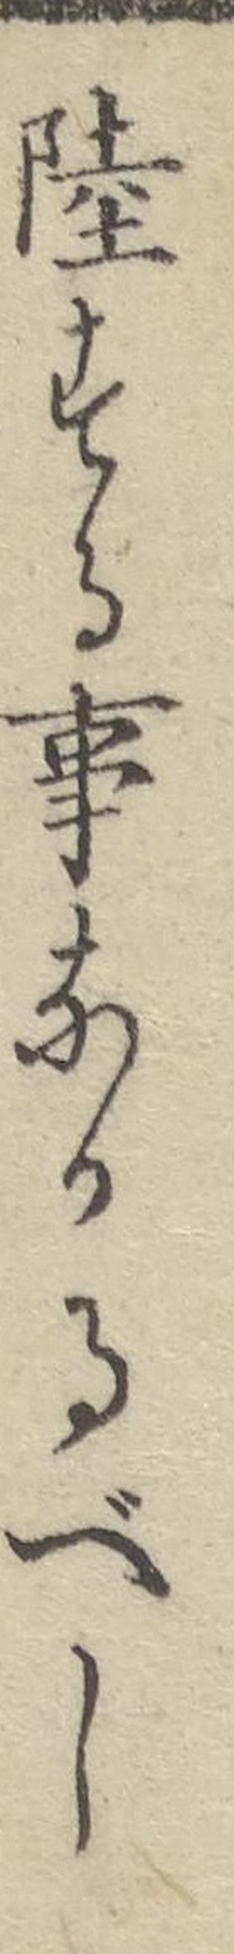陸する事なかるべし
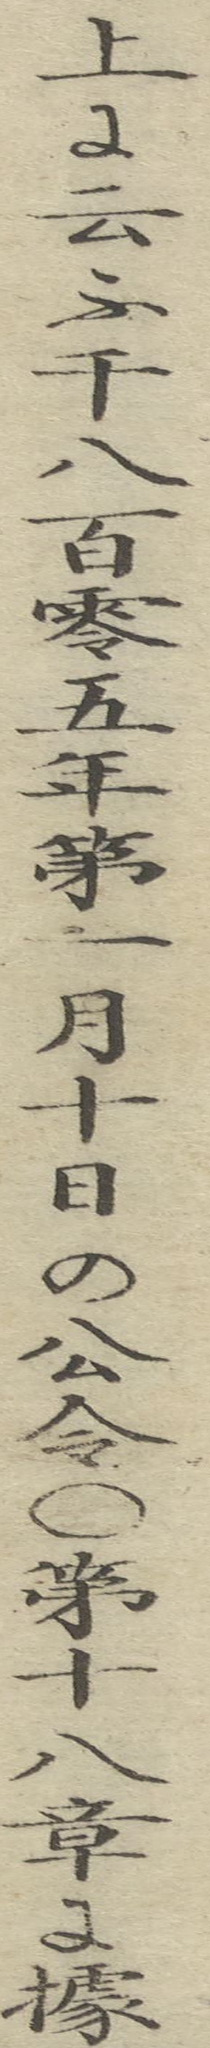上に云ふ千八百零五年第一月十日の公令〇第十八章に據

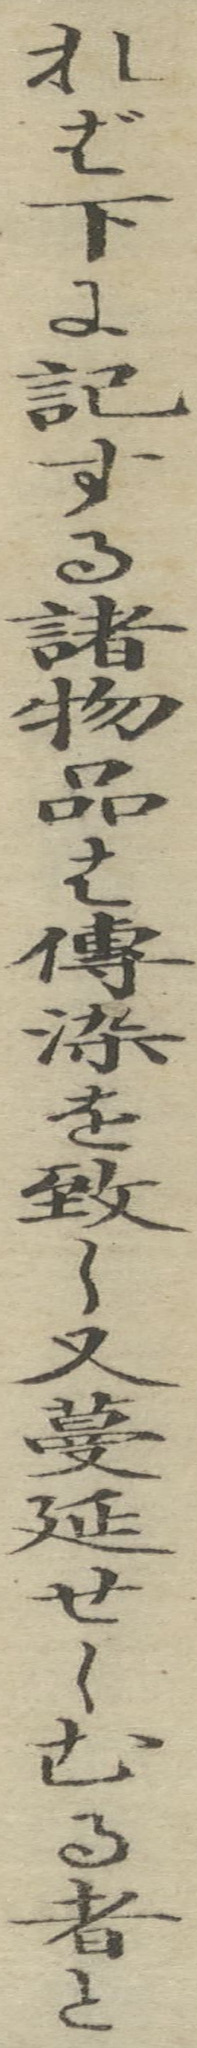れば下に記する諸物品は傅染を致し又萬延せしむる者と
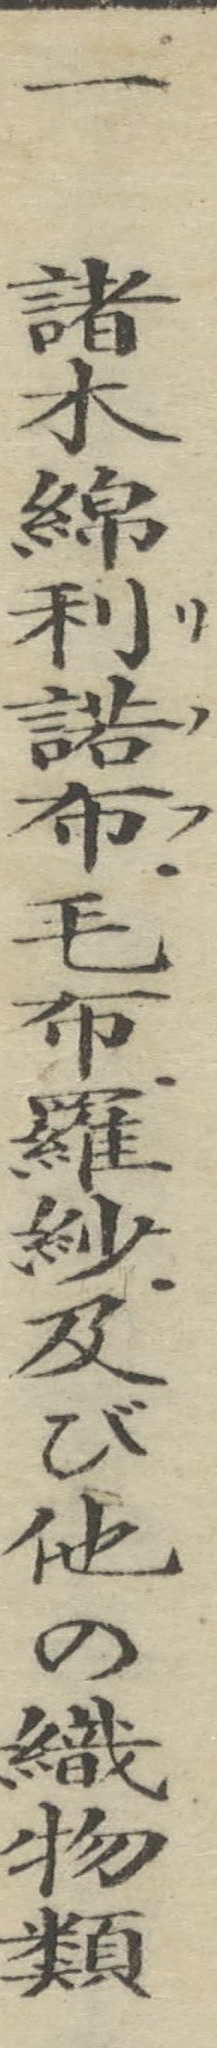一諸木綿利諾布、毛布、羅沙、及び他の織物類
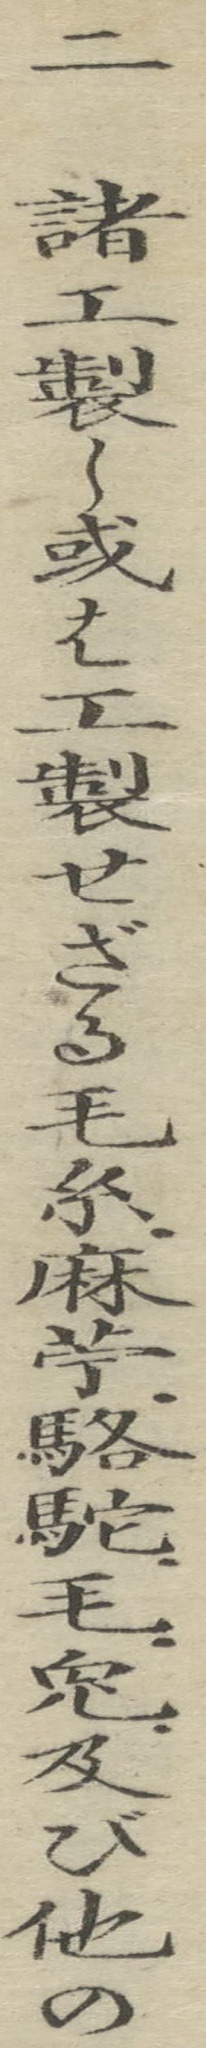二諸工製し或は工製せざる毛糸、麻苧、駱駝、毛、兎、及び他の
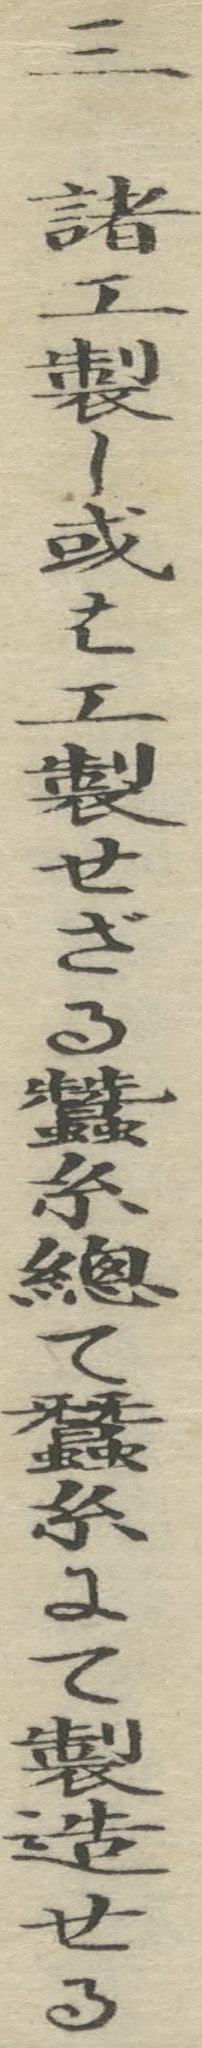三諸工製し或は工製せざる蠶糸総て蠶糸にて製造せる
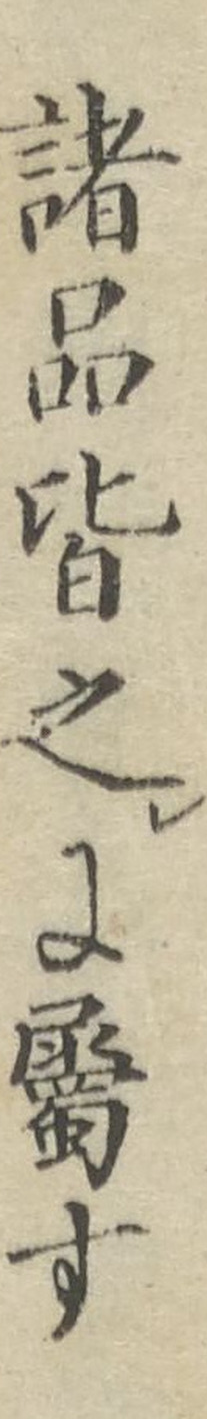諸品皆之屬す
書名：官版疫毒預防説　全
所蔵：東京大学総合図書館 General Library in the University of Tokyo, JAPAN
